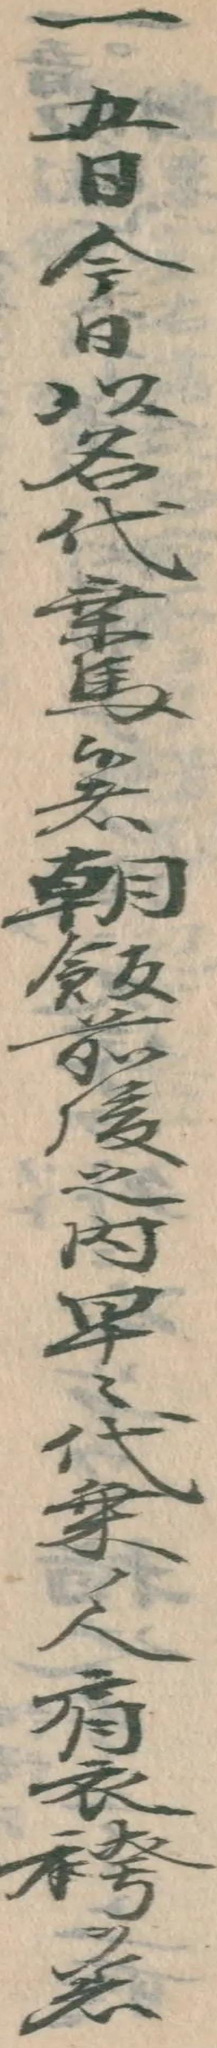一五日今日以名代乗馬候者朝飯前後之内早々代乗ノ人肩衣袴ヲ着
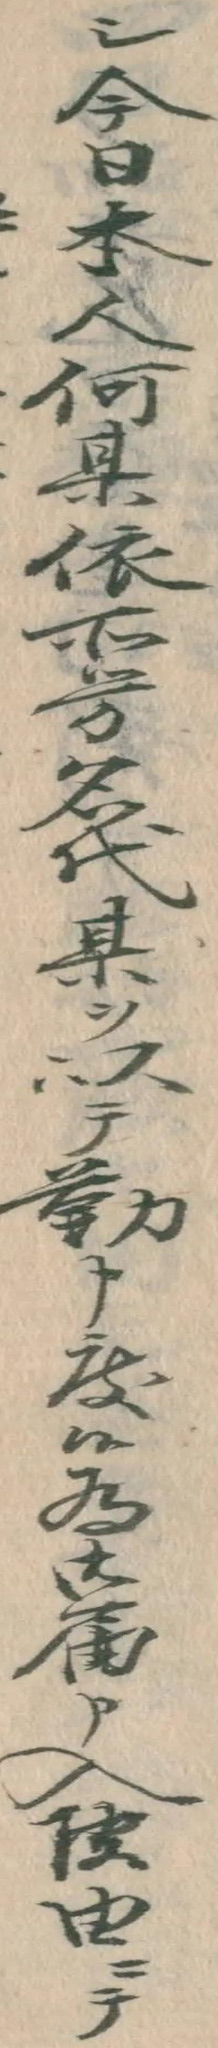シ今日本人何某依所芳名代某ヲ以テ勤申度候為御届申入候由ニテ
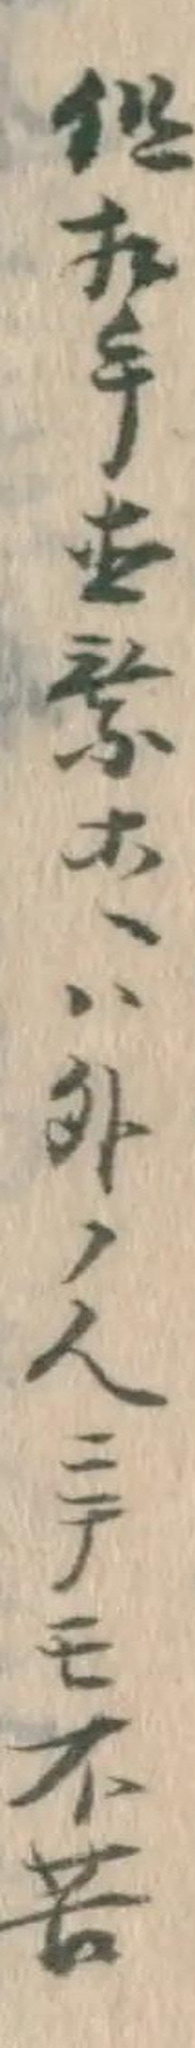但相手直乗等へハ外ノ人ニテモ不苦
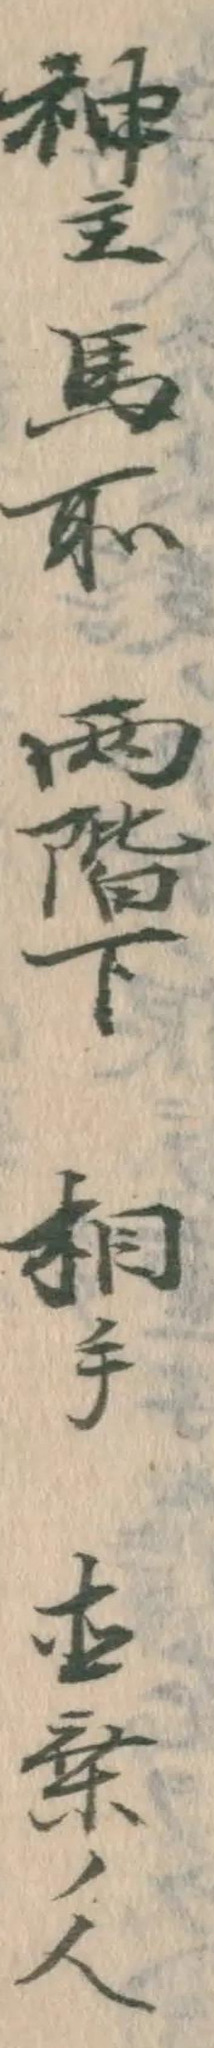神主馬所両階下相手直乗ノ人
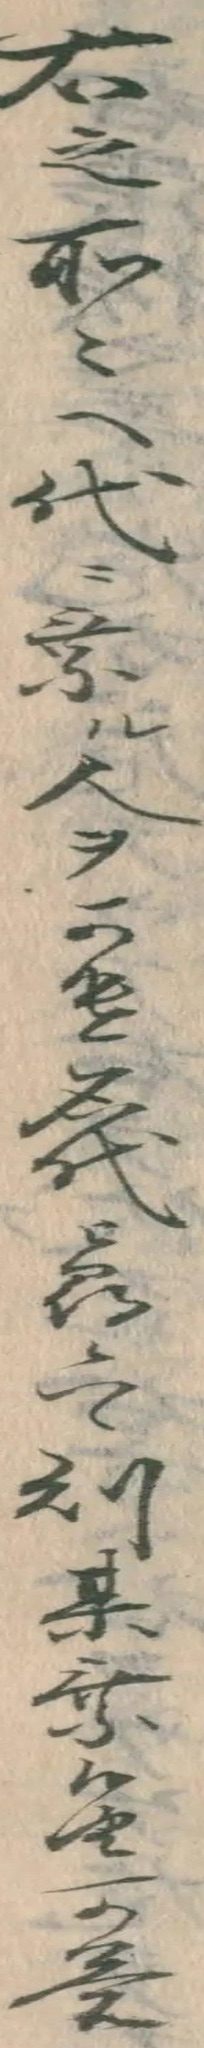右之所々へ代ニ乗ル人ヲ可遣名代被尋候ハヽ則某乗候由可答
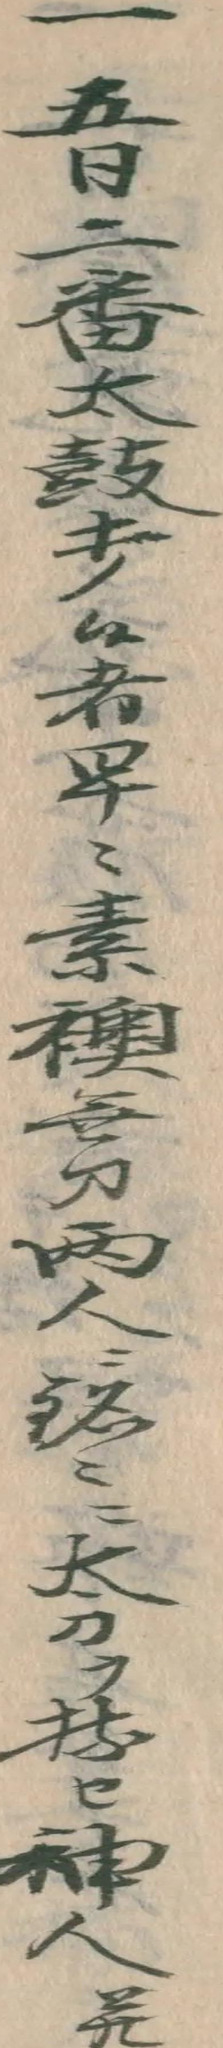一五日二番太鼓打候者早々素襖無刀両人ニ銘々ニ太刀ヲ持セ神人并
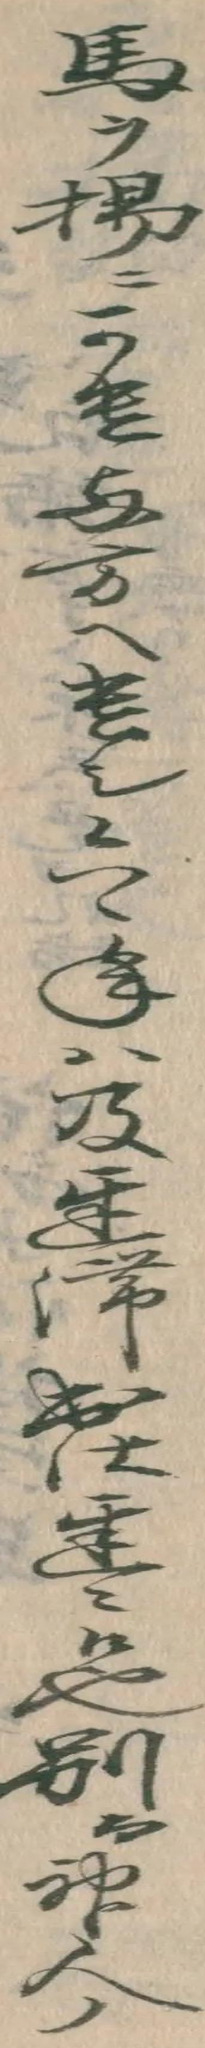馬ヲ揚ニ可遣両方へ遣シ候ハヽ年ハ及遅滞出仕遅々候也別而神人ノ
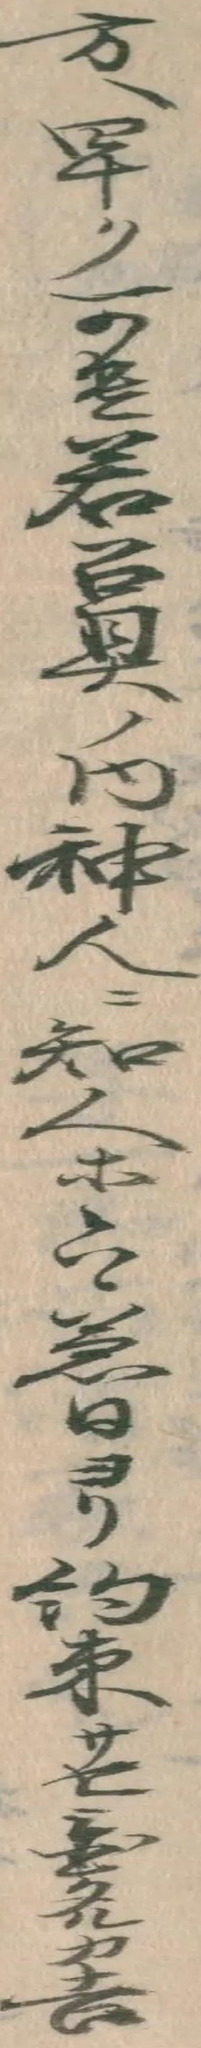方へ早ク可遣若召具ノ内神人ニ知人等候ハヽ兼日ヨリ約束サセ置タルカ吉
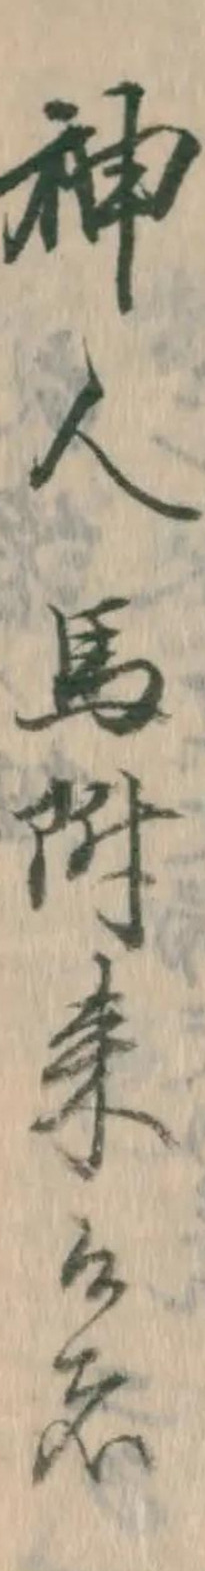神人馬附来候者
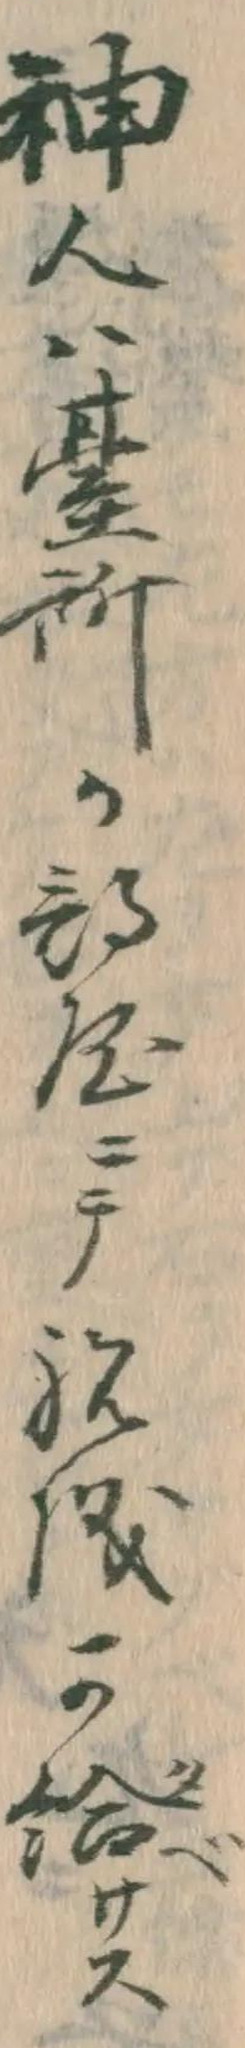神人ハ台所カ部屋ニテ祝儀可給サス
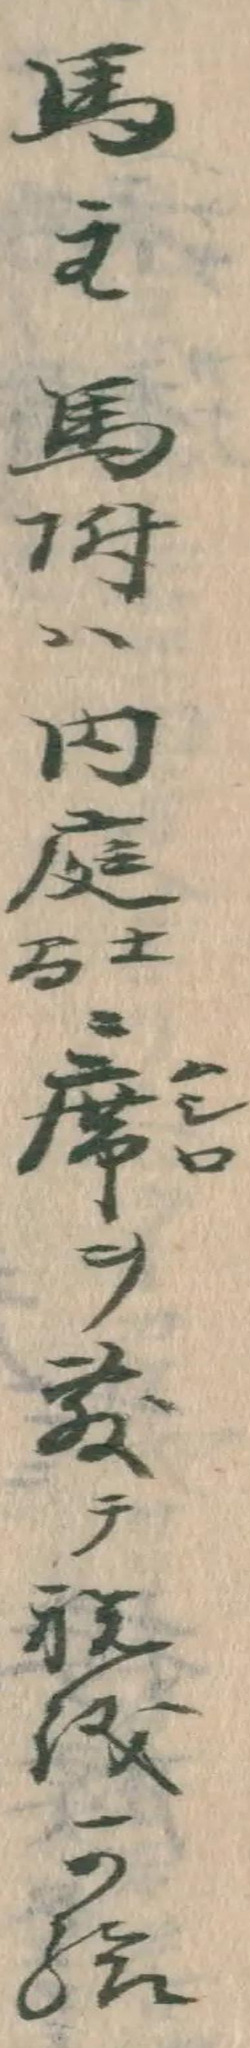馬主馬附ハ内庭土間ニ席ヲ敷テ祝儀可給
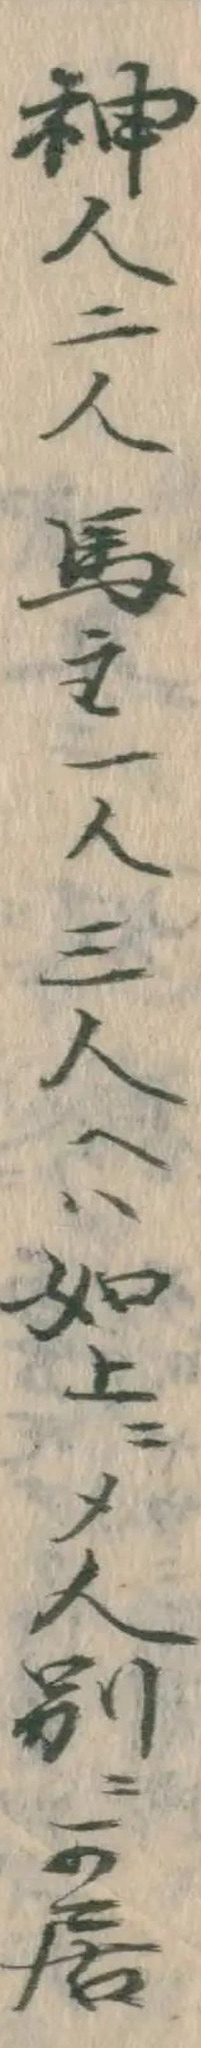神人二人馬主一人三人へハ如上ニシテ人別ニ可居
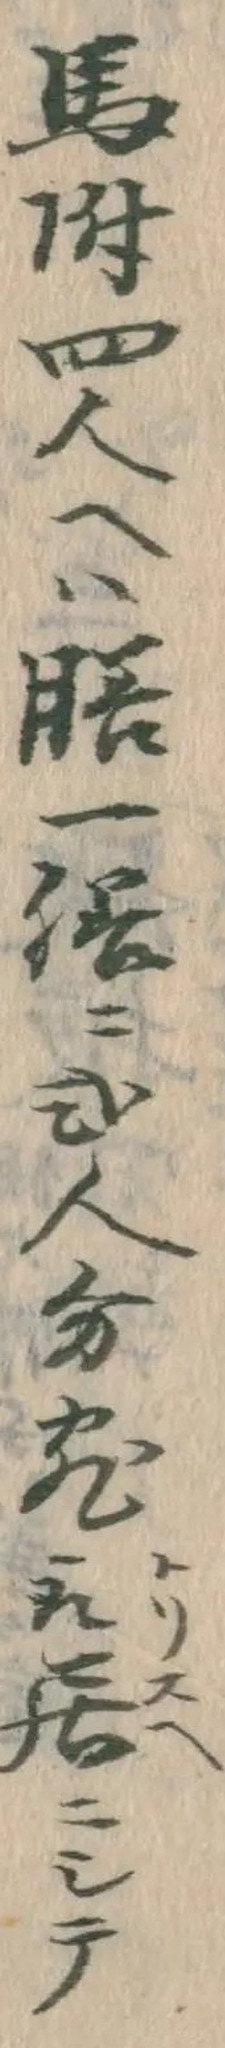馬附四人ヘハ膳一膳ニ弐人分宛取居ニシテ
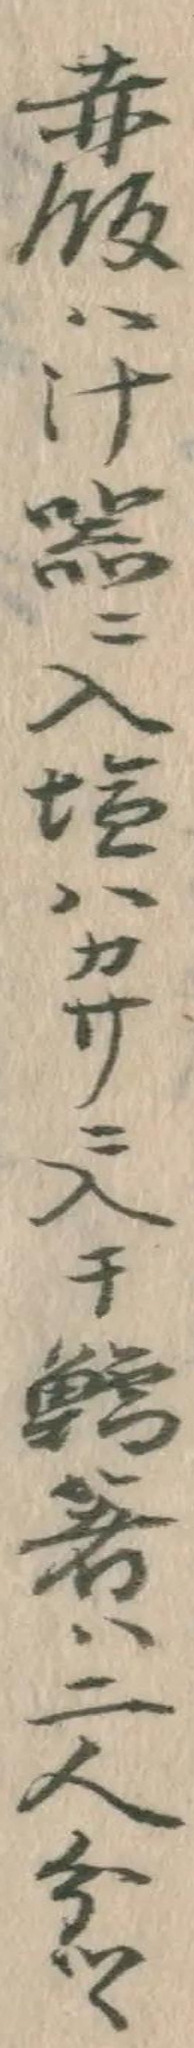赤飯ハ汁器ニ入塩ハカサニ入干鱈箸ハ二人分ツヽ
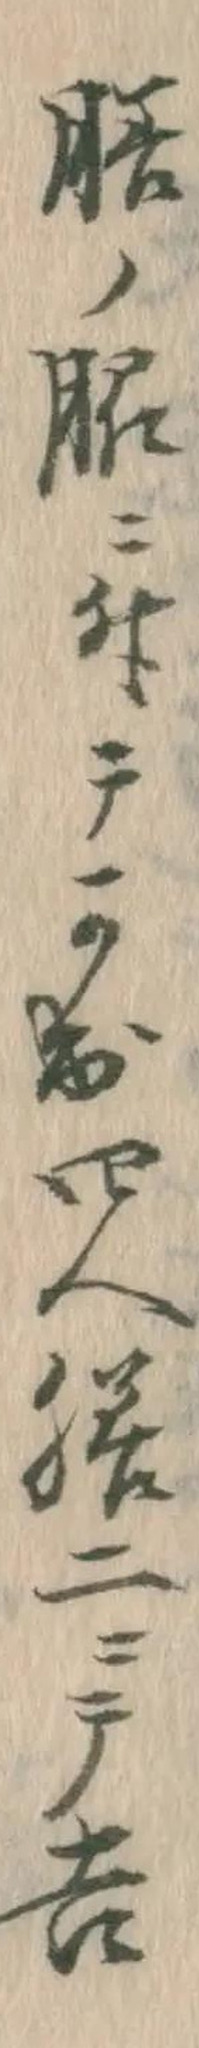膳ノ脇ニ付テ可出四人膳二ニテ吉
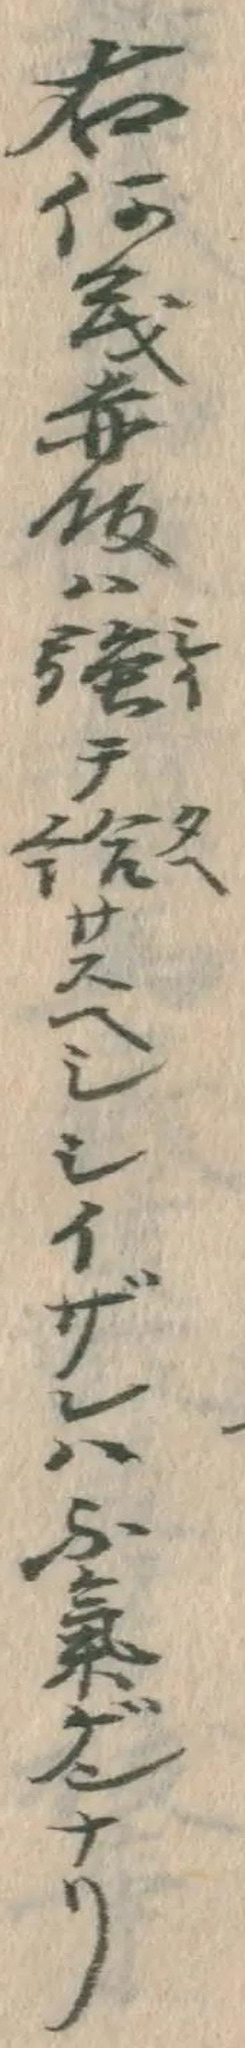右何茂赤飯ハ強テ給サスヘシシイザレハ不気ゲンナリ
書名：賀茂社記録. 第11冊
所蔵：国立国会図書館 National Diet Library, JAPAN
